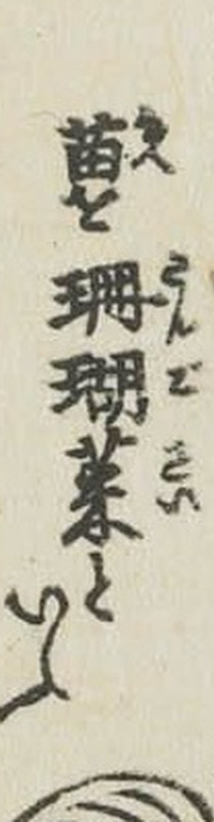苗を珊瑚菜といふ
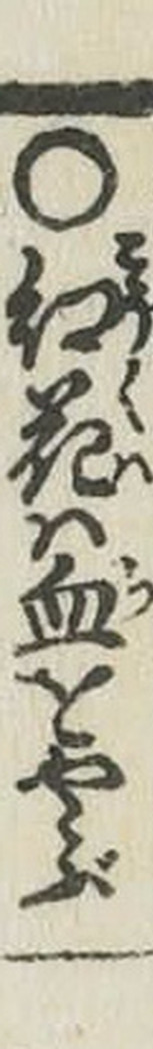○紅花は血をやぶ
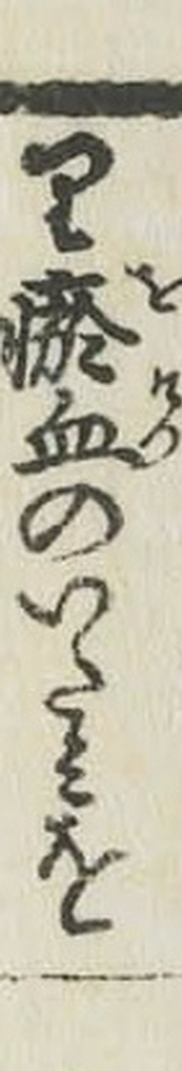り瘀血のいたみを
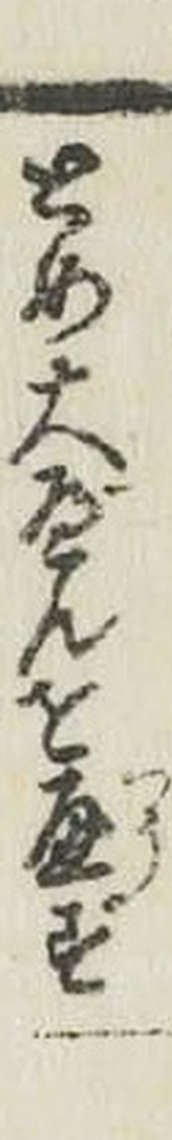とめ大べんを通ず
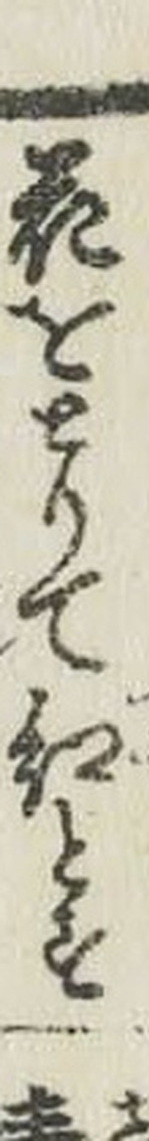花をとりて紅とす
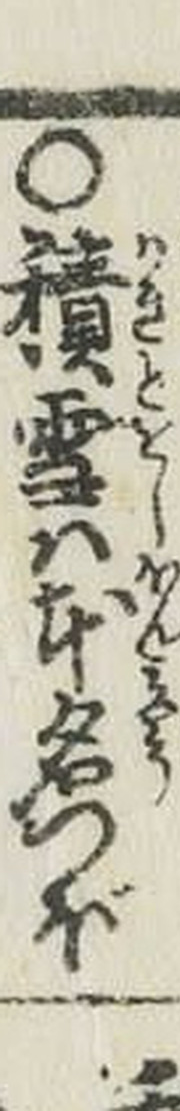○積雪は本名つぼ
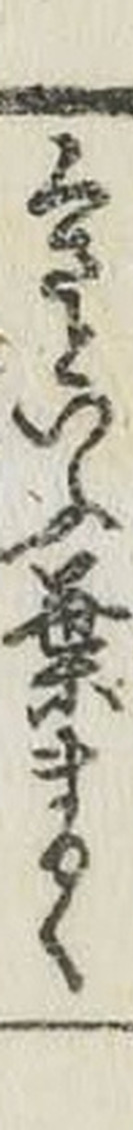くさといふ葉まるく
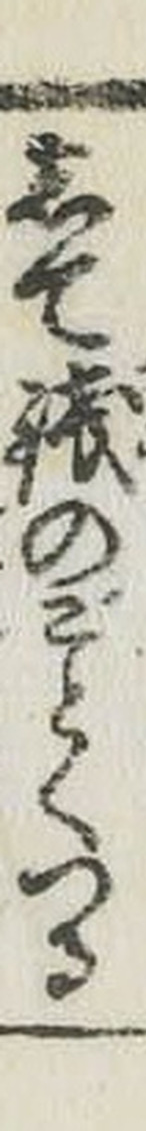して銭のごとくつる
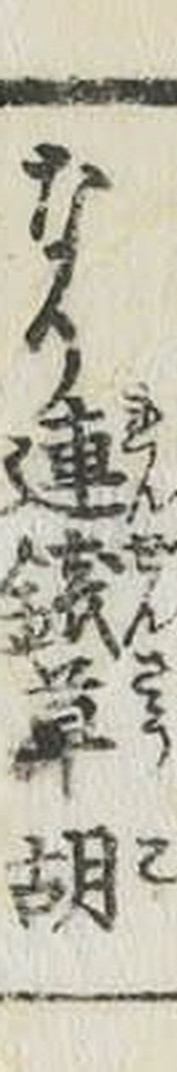なり連銭草胡
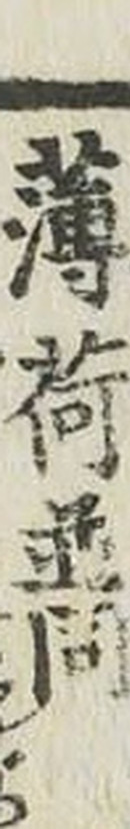薄荷並同
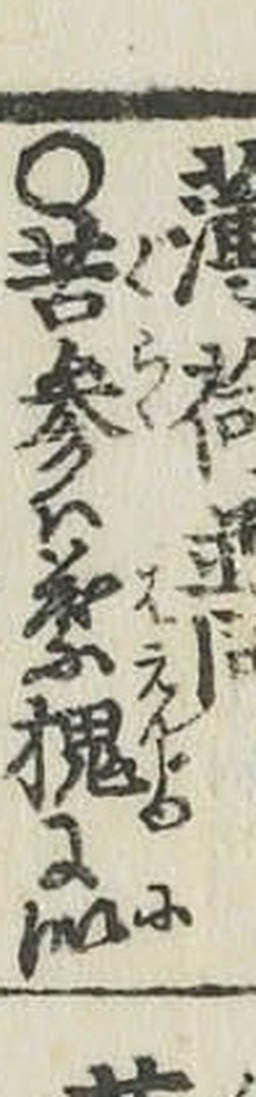○苦参は葉槐に似
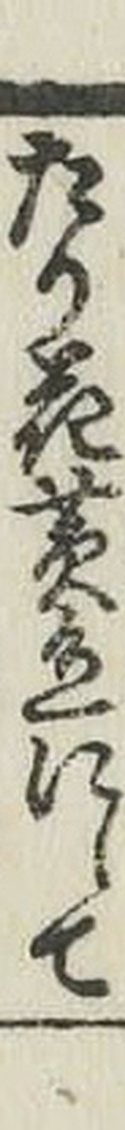たり花黄色にして
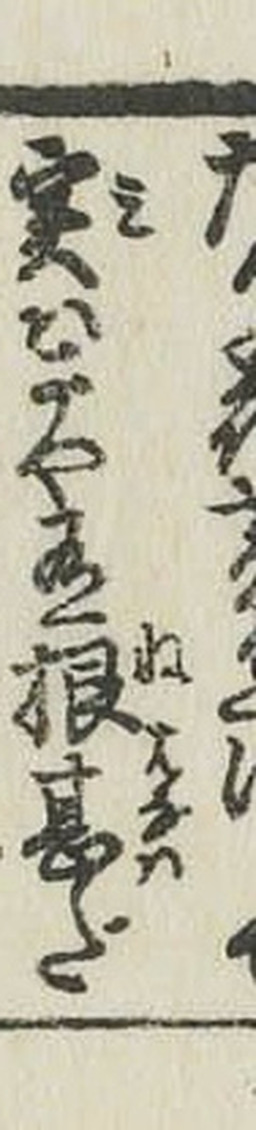実はさや有根甚だ
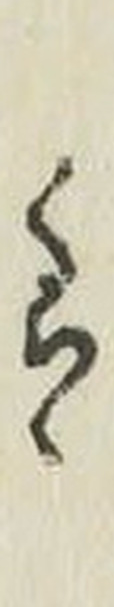くらゝ
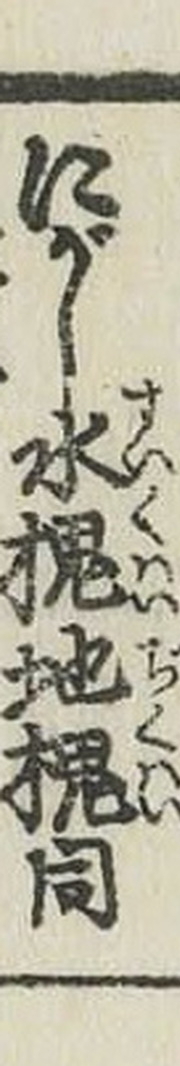にがし水槐地槐同
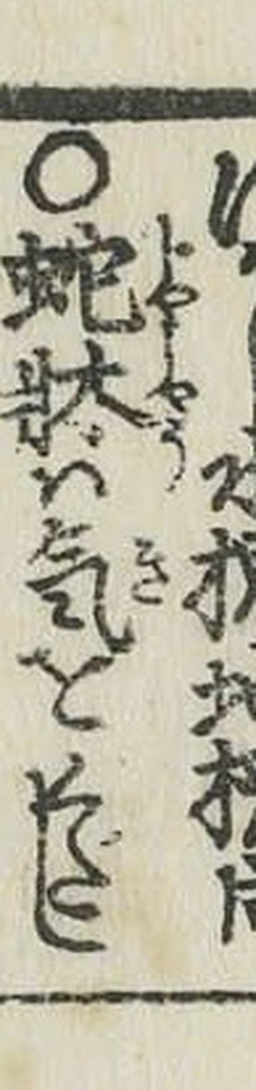○蛇牀は気をくだし
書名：増補頭書訓蒙図彙大成 10巻 9:巻之20
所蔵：東京学芸大学教育コンテンツアーカイブ
